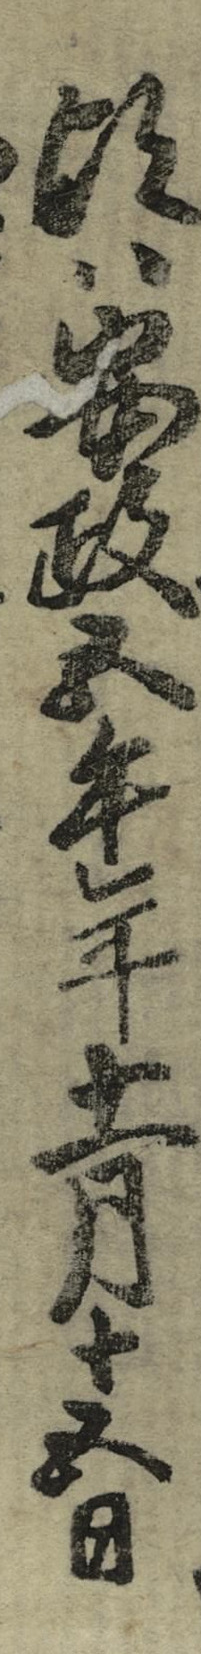頃ハ安政五午年十一月十五日
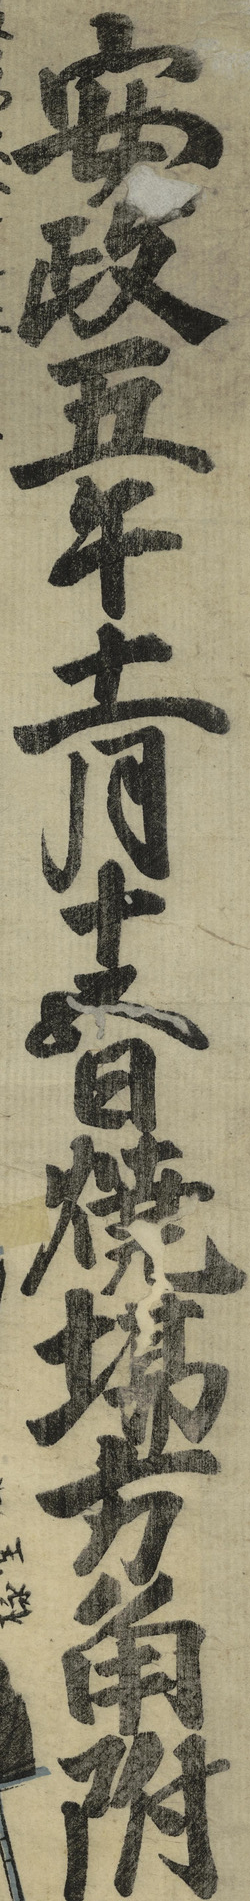安政五午十一月十五日焼場方角附
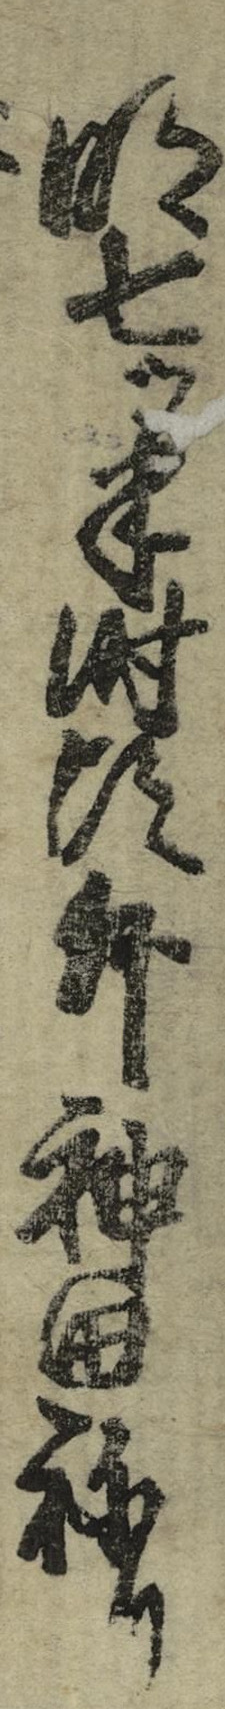明七ツ半時頃外神田ねり
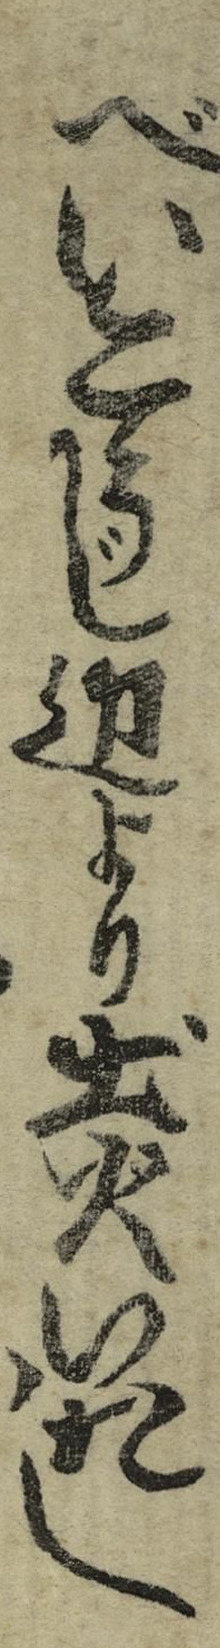べいこうじ辺より出火いたし
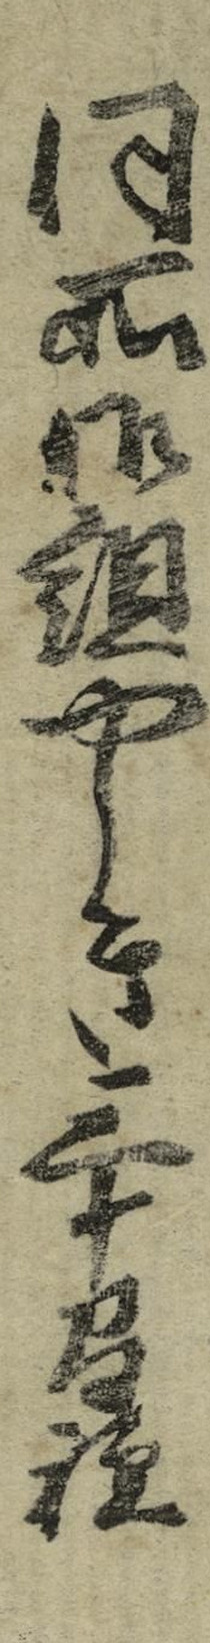同所御組やしき三十間程
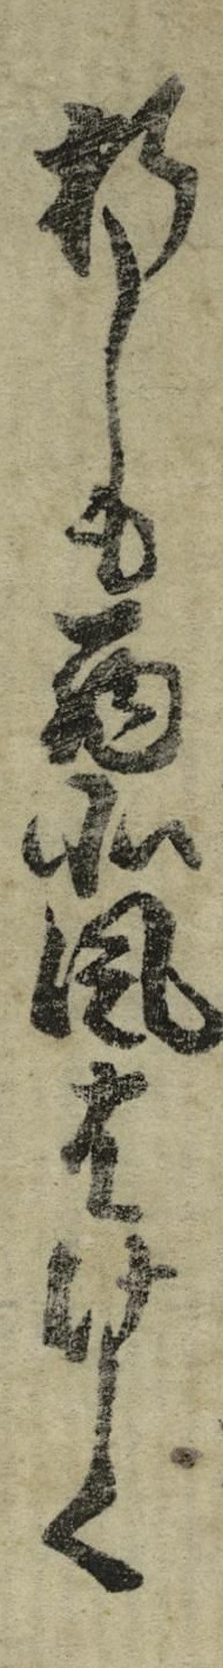折しも西北風はけしく
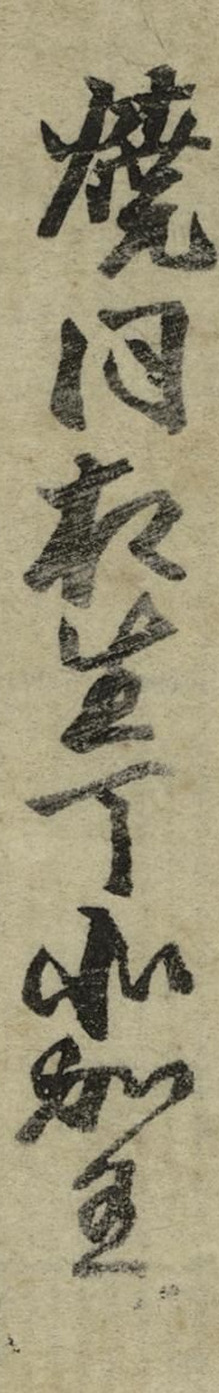焼同相生丁北かわ
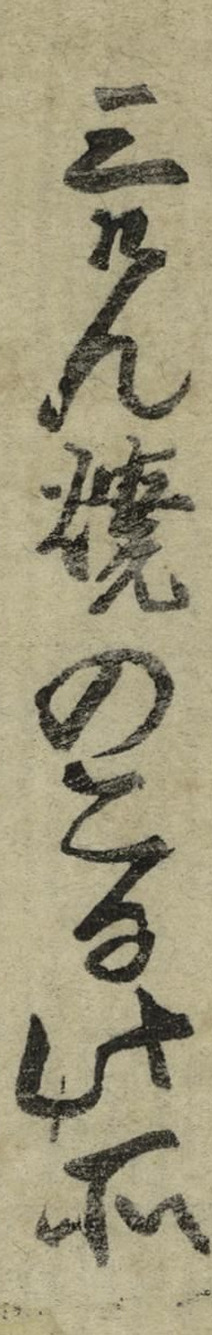三けん焼のこる此所
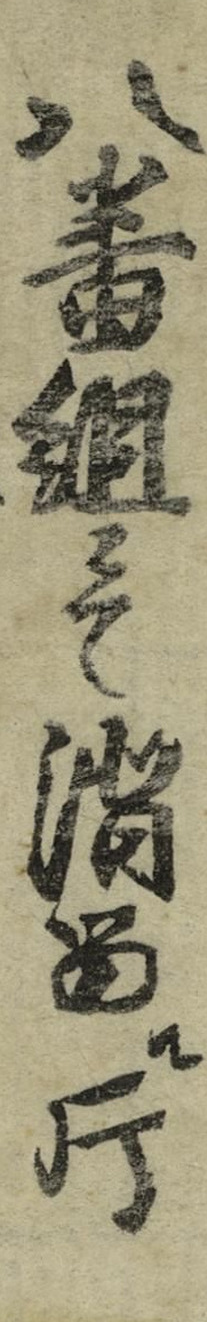八番組にて消留ル片
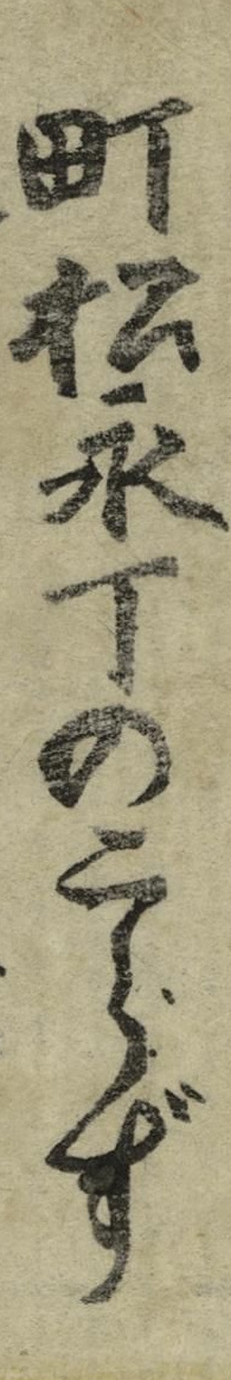町松永丁のこらず
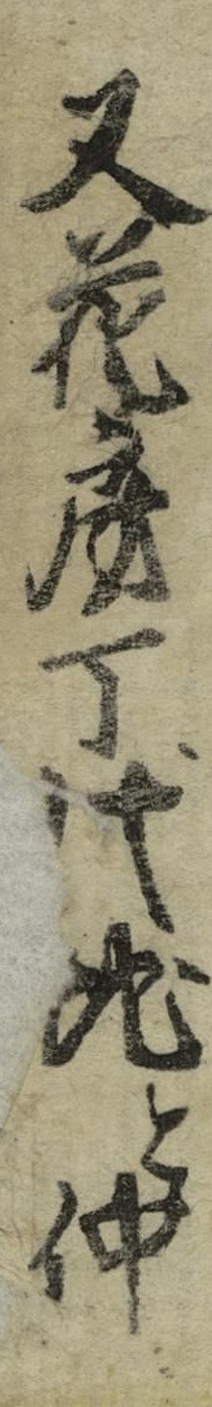又花房丁代地と仲
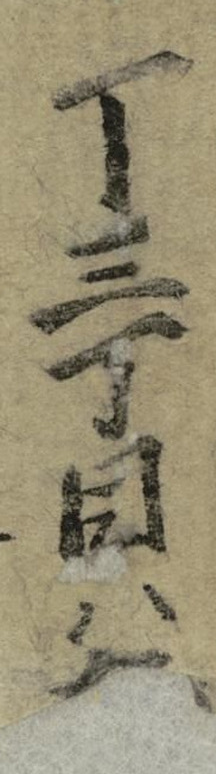丁三丁目ハ
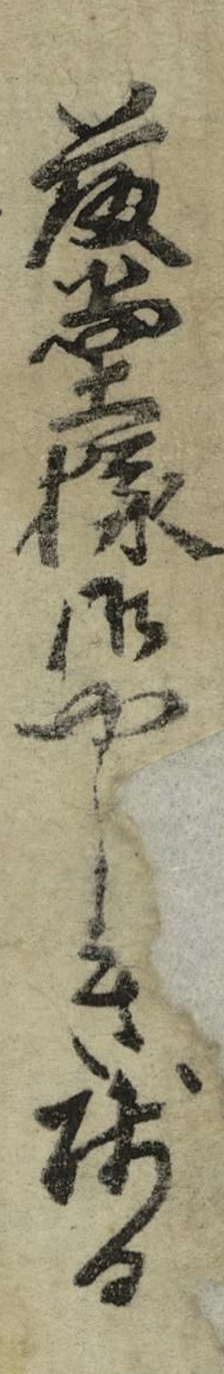藤堂様御やしき残る
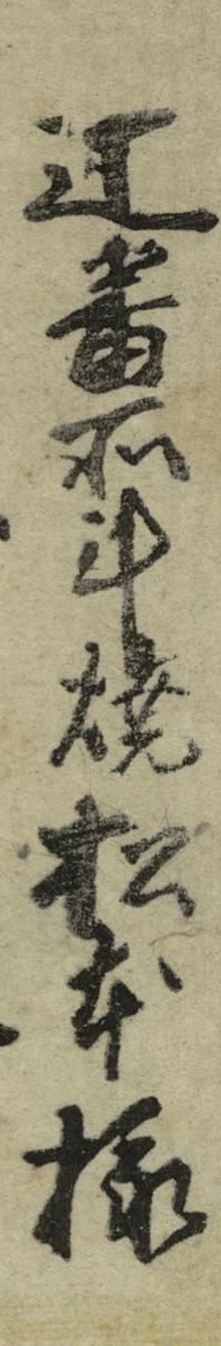辻番所斗焼松本様
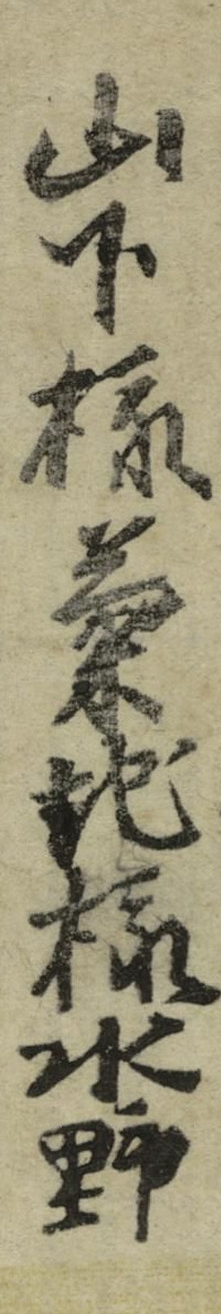山下様菊池様水野
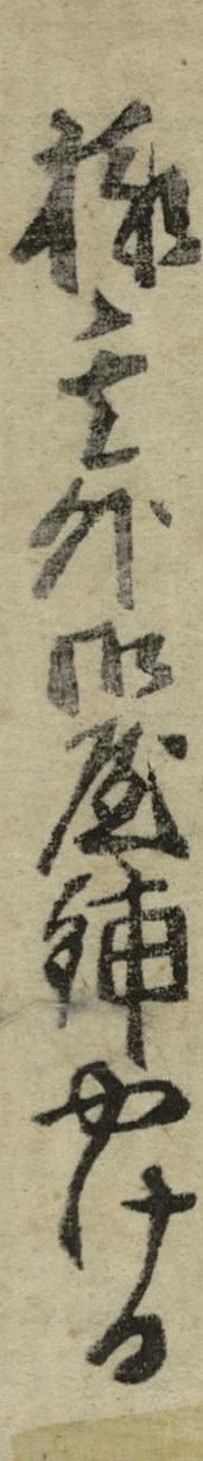様其外御屋鋪やける
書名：安政五午十一月十五日焼場方角附
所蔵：東京大学地震研究所図書室 Earthquake Research Institute Library, The University of Tokyo, JAPAN
